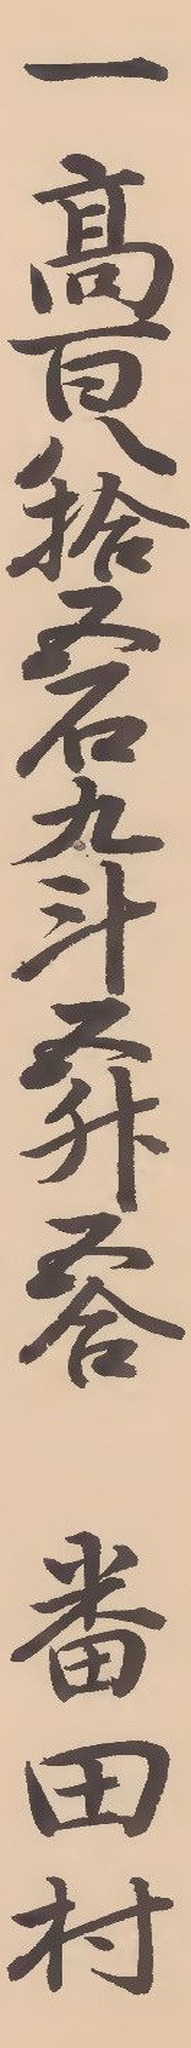一高百八拾五石九斗五升五合番田村
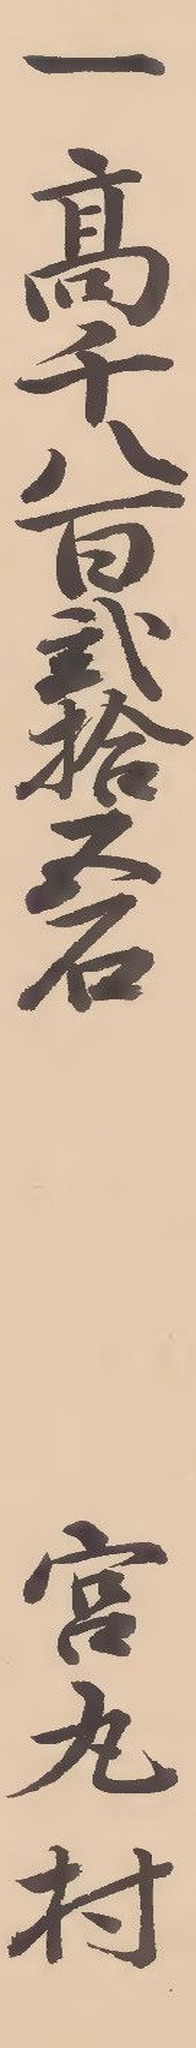一高千八百弐拾五石宮丸村
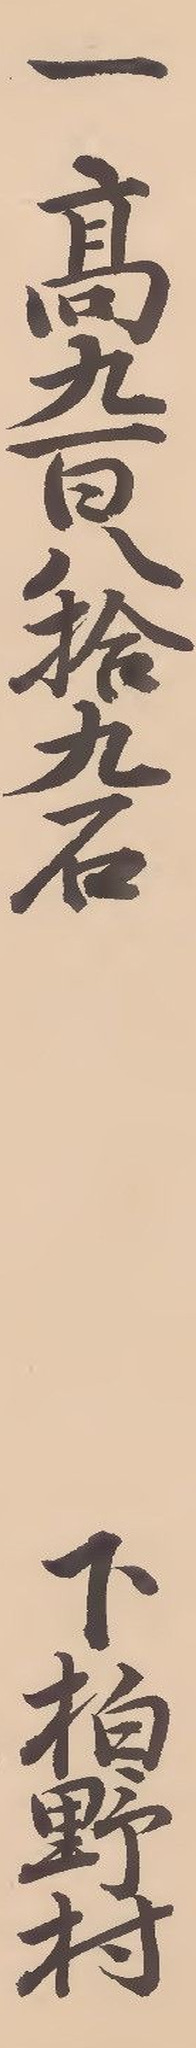一高九百八拾九石下柏野村
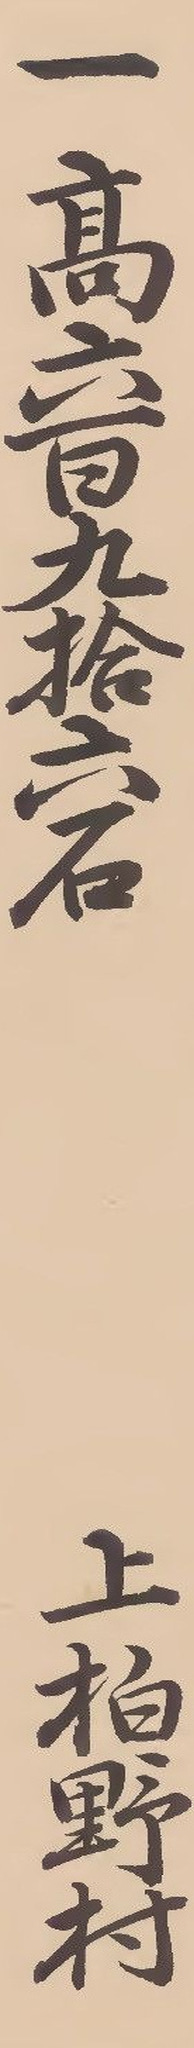一高六百九拾六石上柏野村
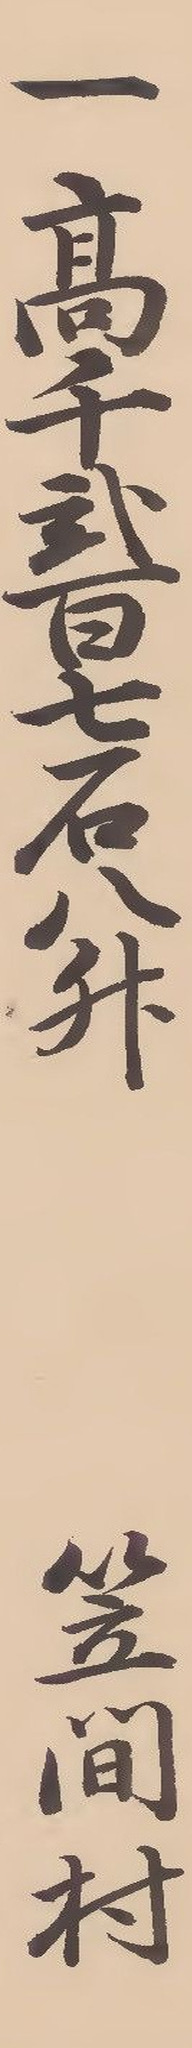一高千弐百七石八升笠間村

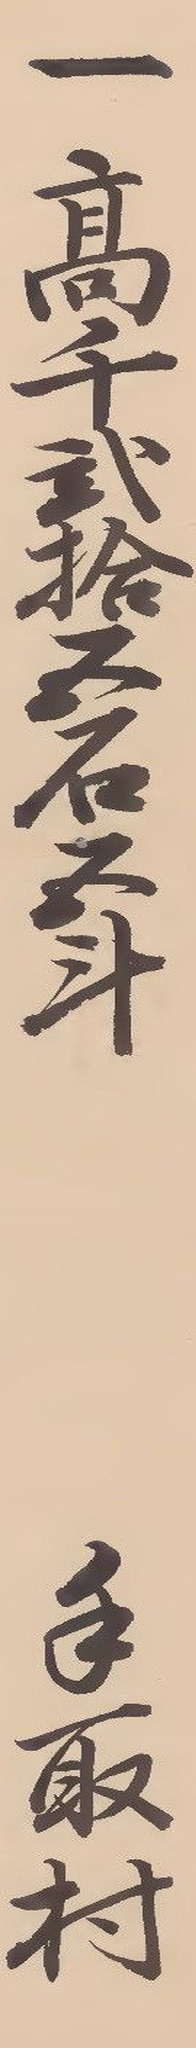一高千弐拾五石五斗手取村
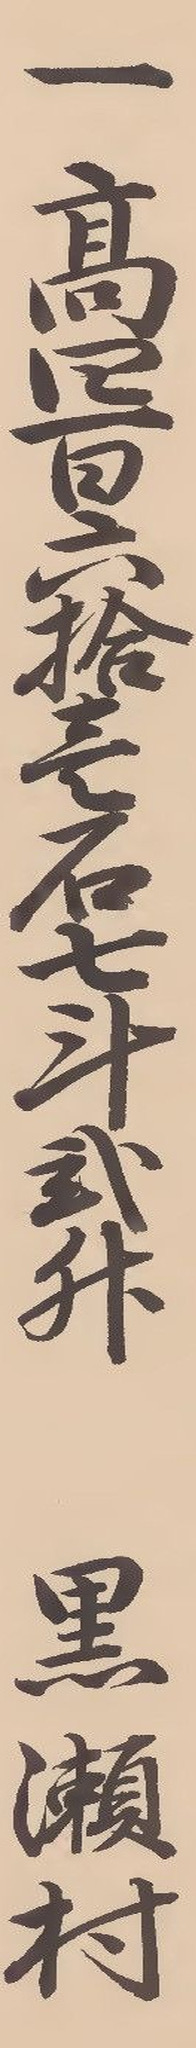一高四百六拾壱石七斗弐升黒瀬村
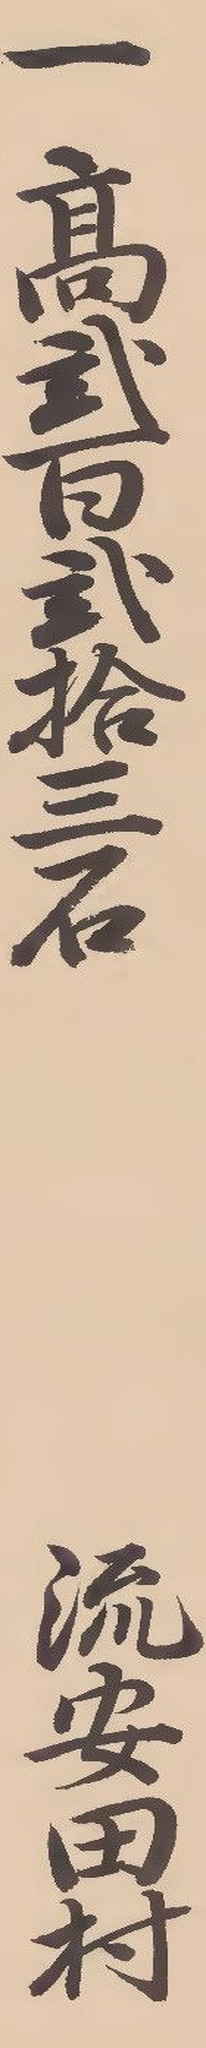一高弐百弐拾三石流安田村
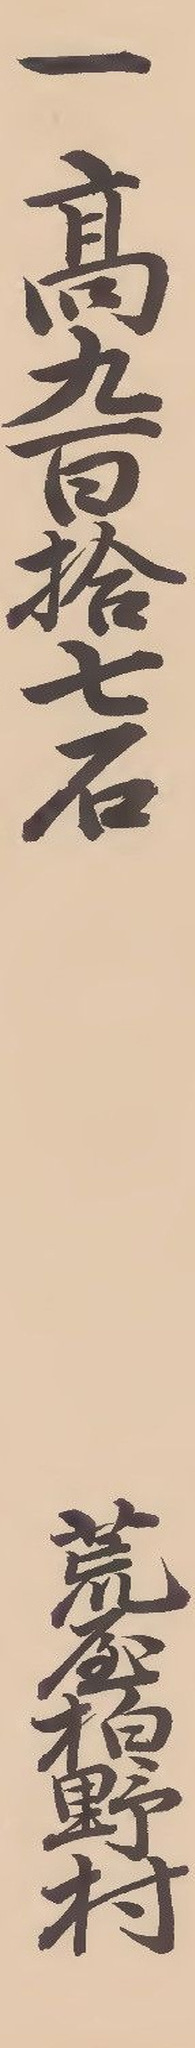一高九百拾七石荒屋柏野村
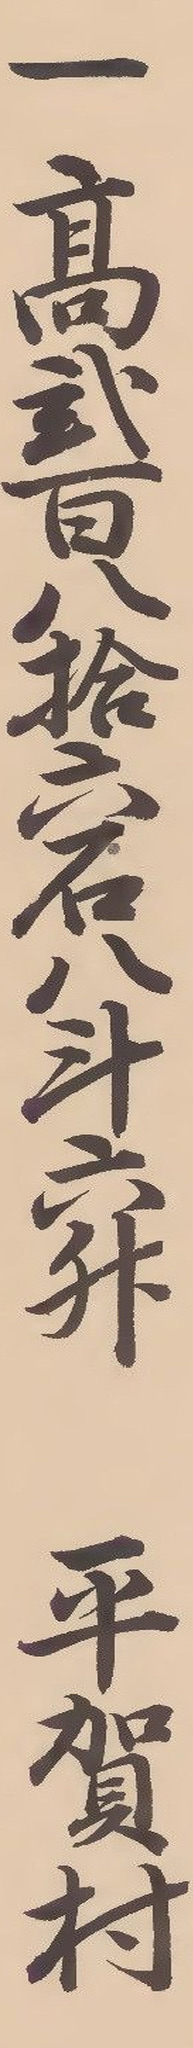一高弐百八拾六石八斗六升平賀村

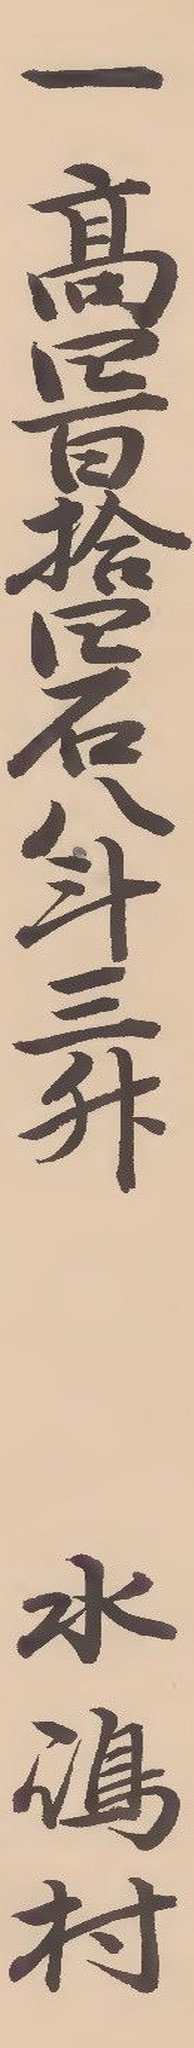一高四百拾四石八斗三升水島村
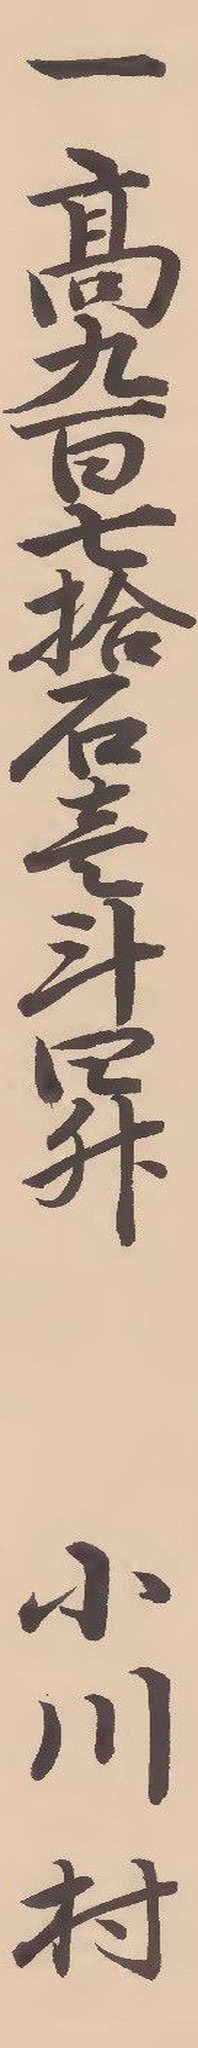一高九百七拾石壱斗四升小川村
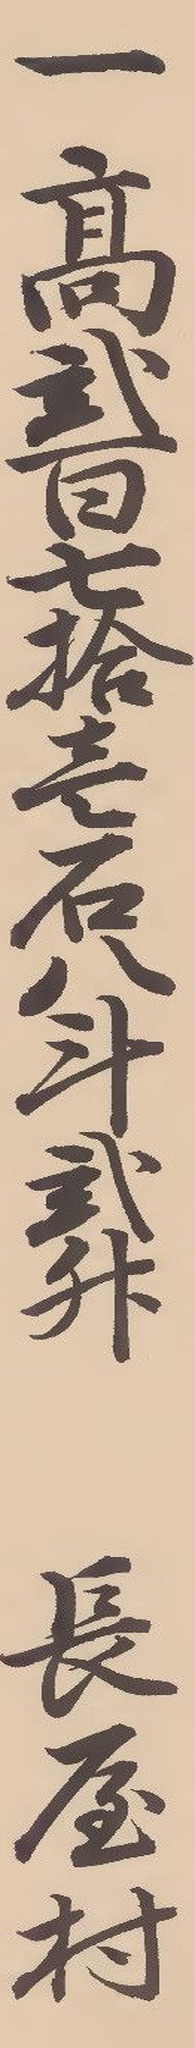一高弐百七拾壱石八斗弐升長屋村
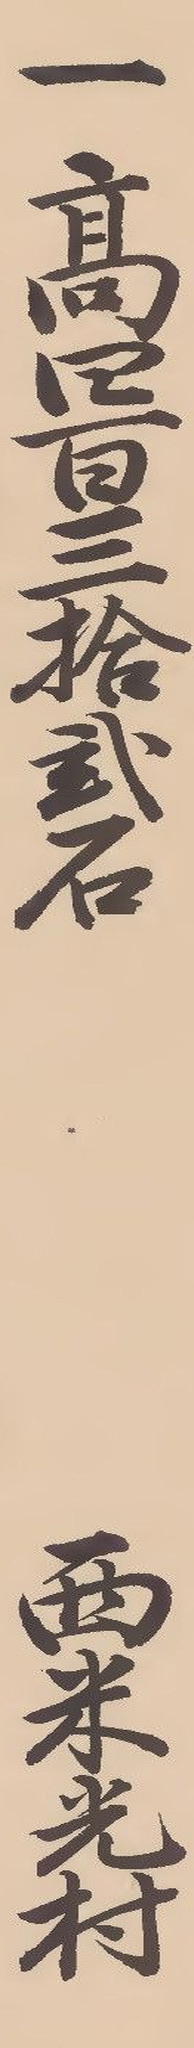一高四百三拾弐石西米光村
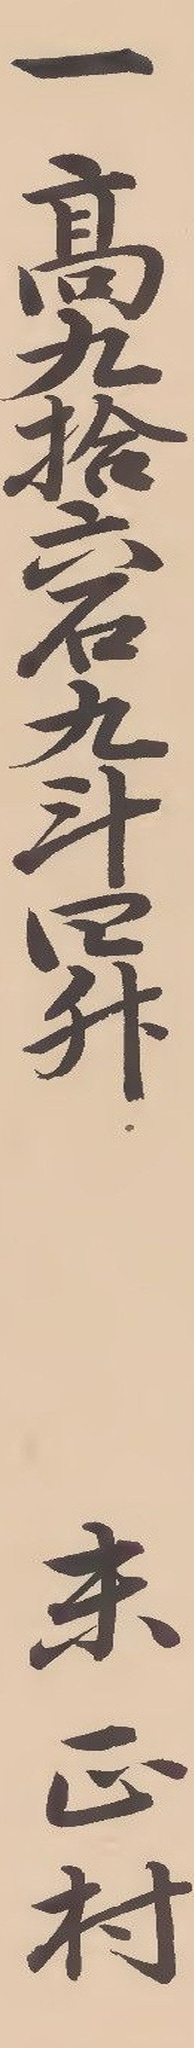一高九拾六石九斗四升末正村
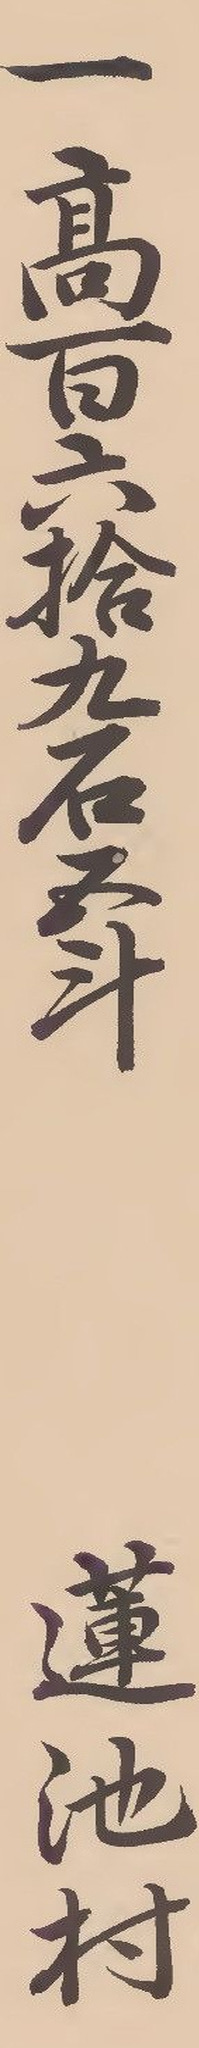一高百六拾九石五斗蓮池村
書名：加賀国郷帳
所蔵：国立公文書館 National Archives of Japan
